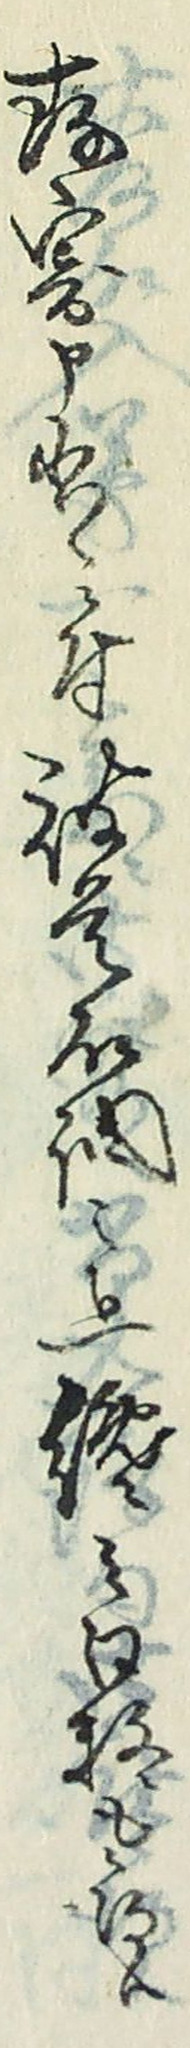存寄申出候ニ付彼是取調之上讒之日数ニも候得ハ
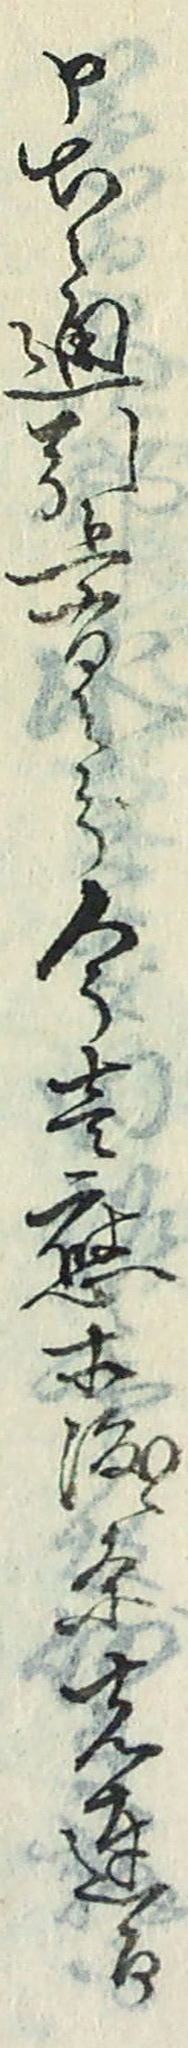申出之通引上有之分今壱應相渡候条先達而
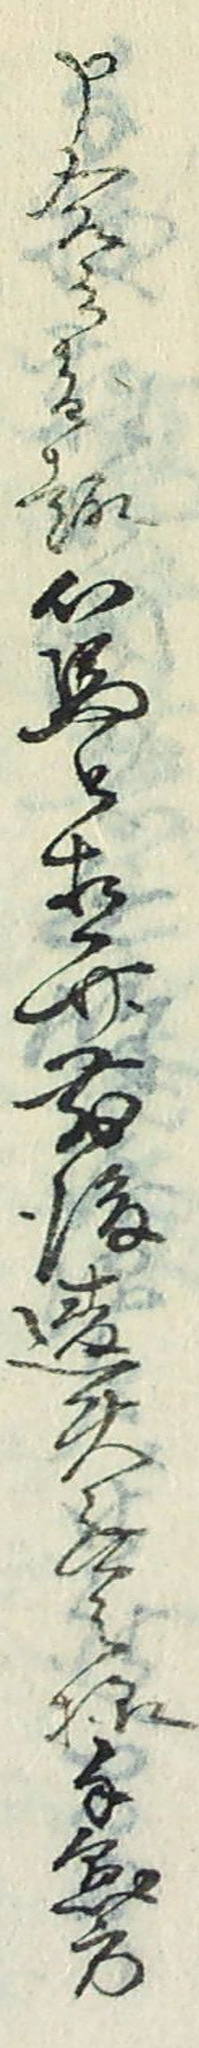申合候旨趣篤と相弁前後違失無之様手懸方
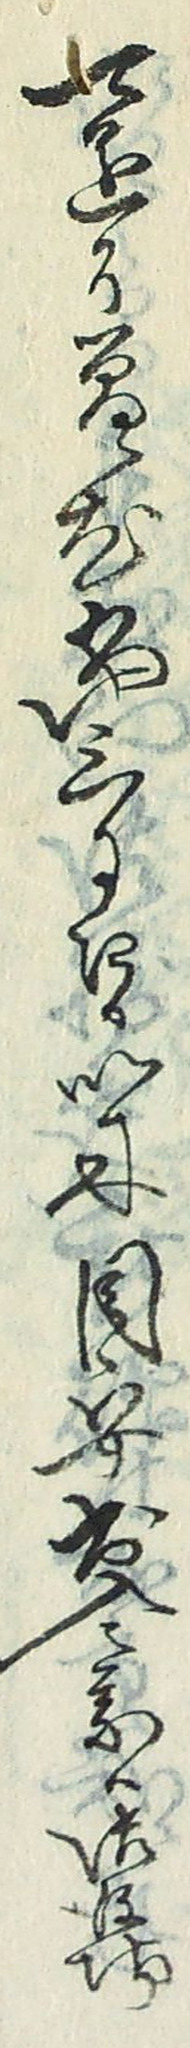可遂了簡候尤當三月四日以来目安出入之義ハ御役場
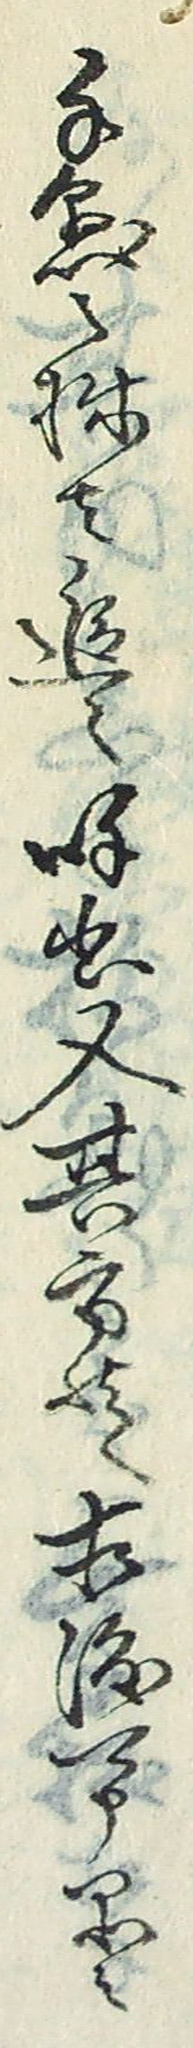手懸之株者追々呼出又其方共へ相渡可申品之
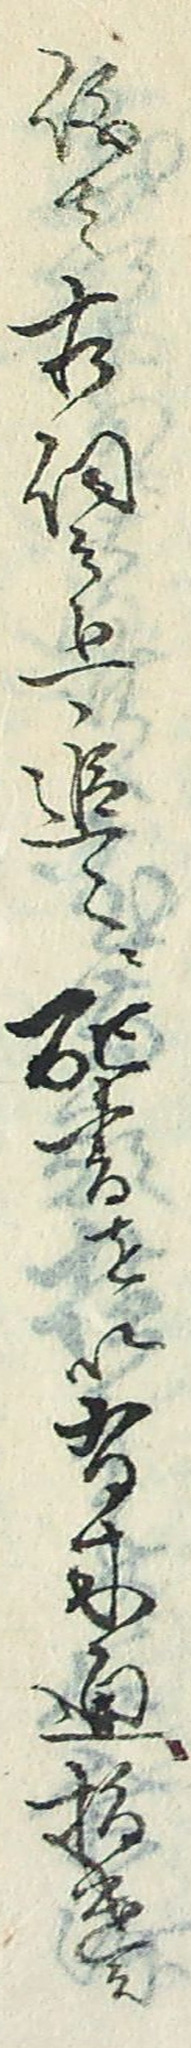儀者相伺之上追々ニ配書を以有来通指遣候
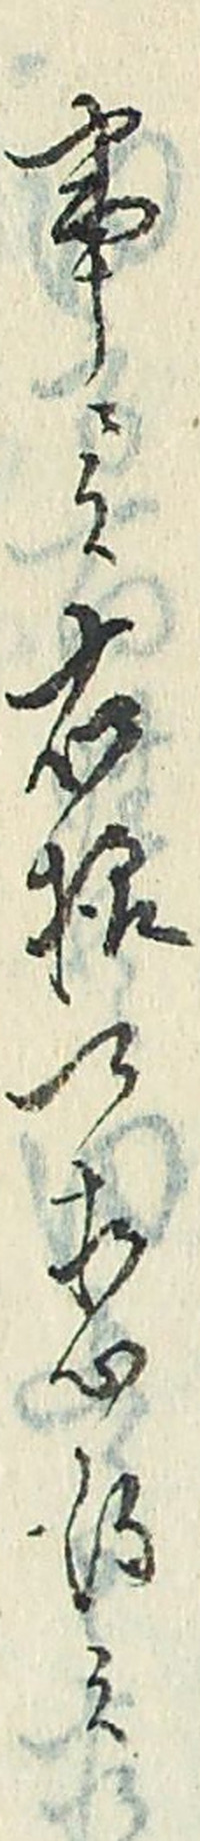事ニ候右様可相心得候
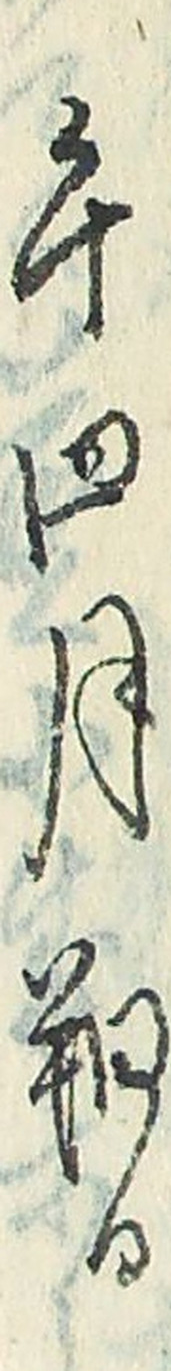午四月朔日

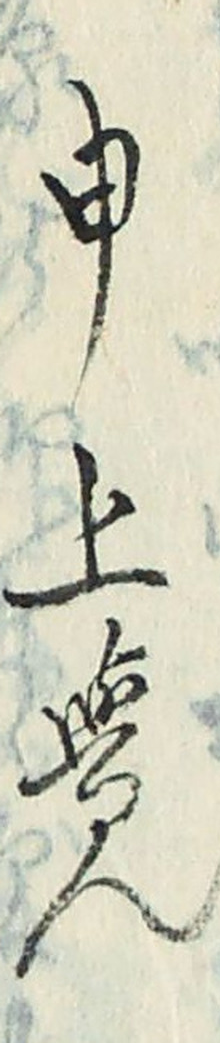申上覺
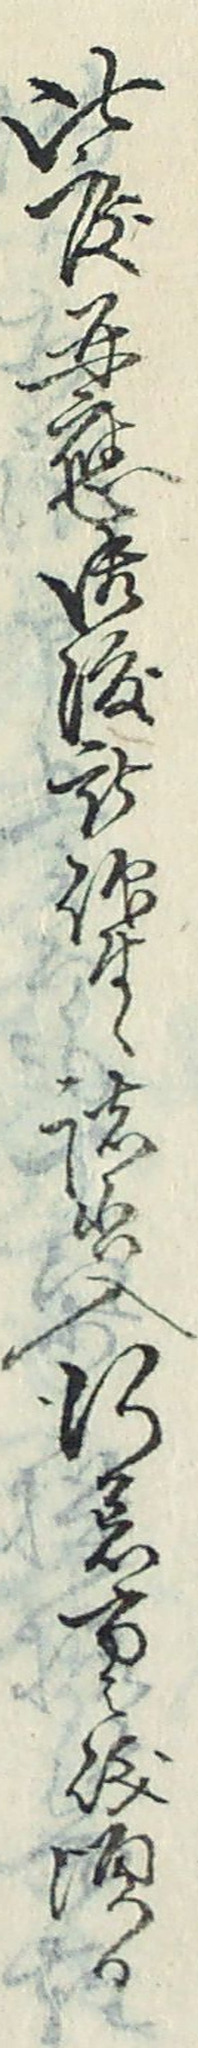此度再應御渡被仰付候諸出入行着方之儀頃日
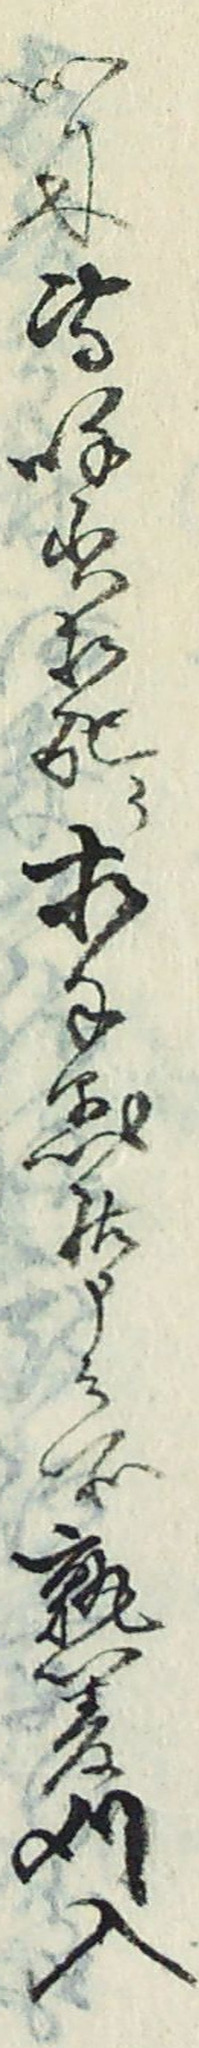以来専呼出相配り相手懸居申候所熟麦刈入
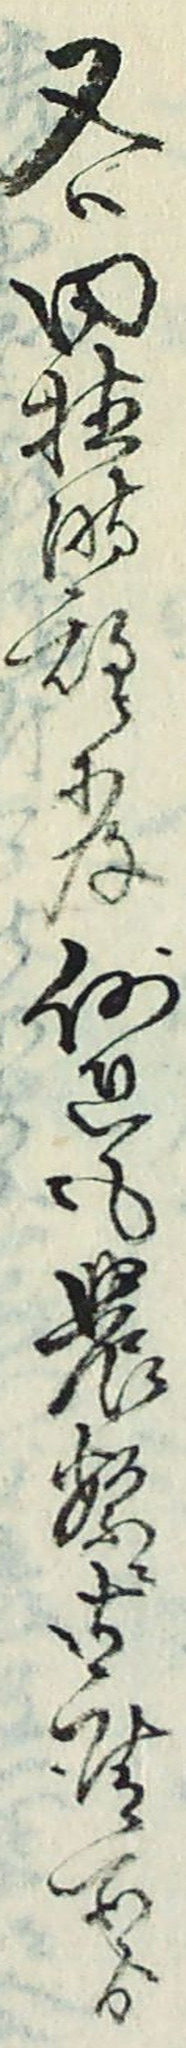又ハ田植時期ニ相及何れも農繁ニ御座候所ゟ
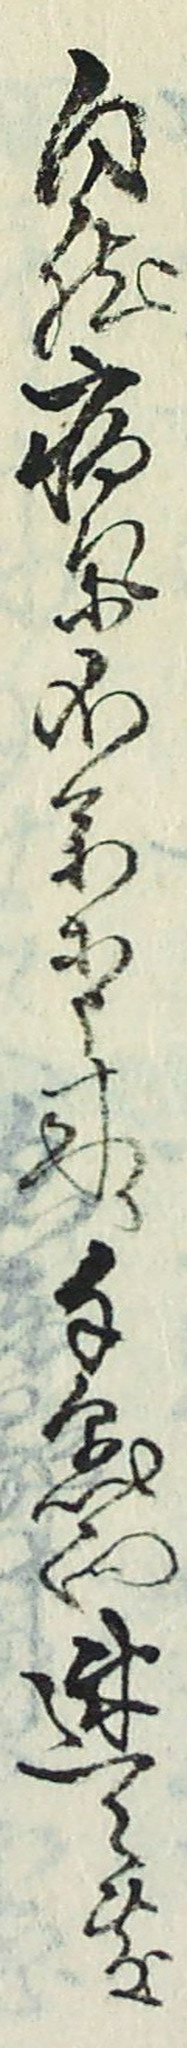自然病気不参等申来り手懸向速々敷
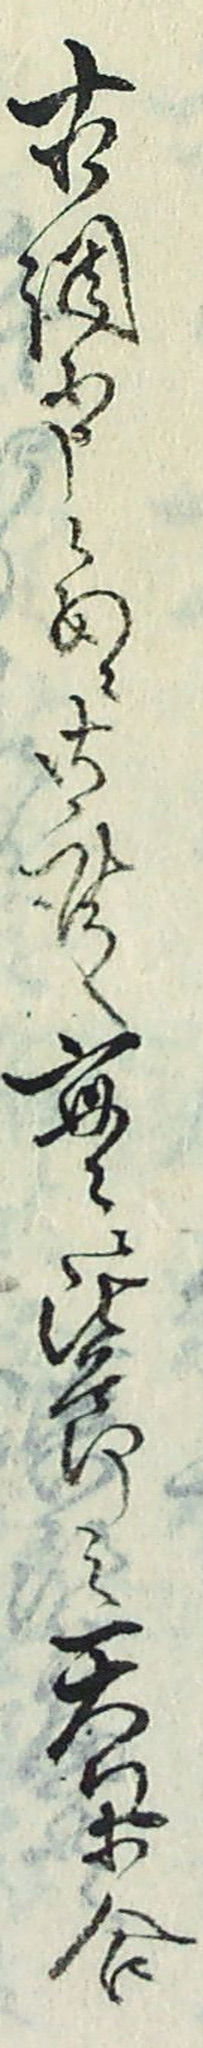相調不申候義ニ御座候實ニ此節之天氣合
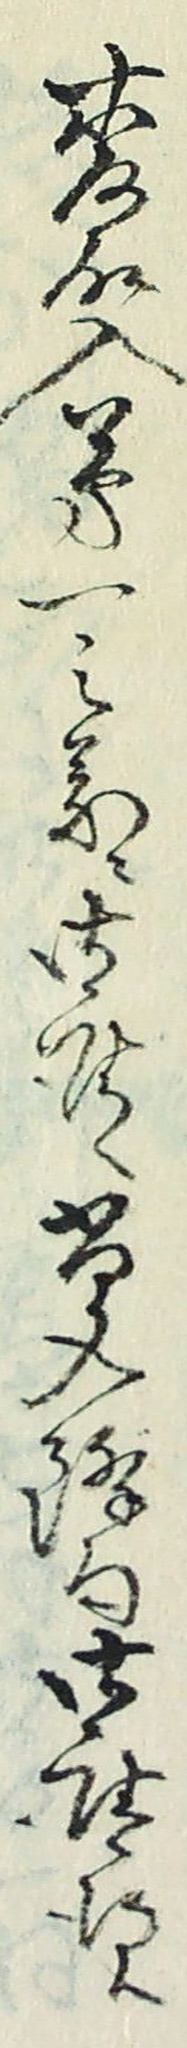麦取入第一之義ニ御座候尚又降旬御座候得ハ
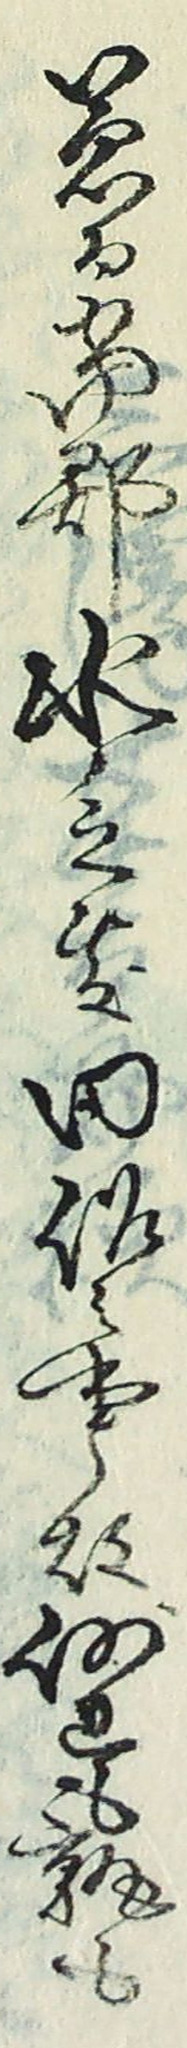兼而當郡水乏敷田作之事故何れも孰も
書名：諸御趣意書并御下知向之写
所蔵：鳴門教育大学 Naruto University of Education
